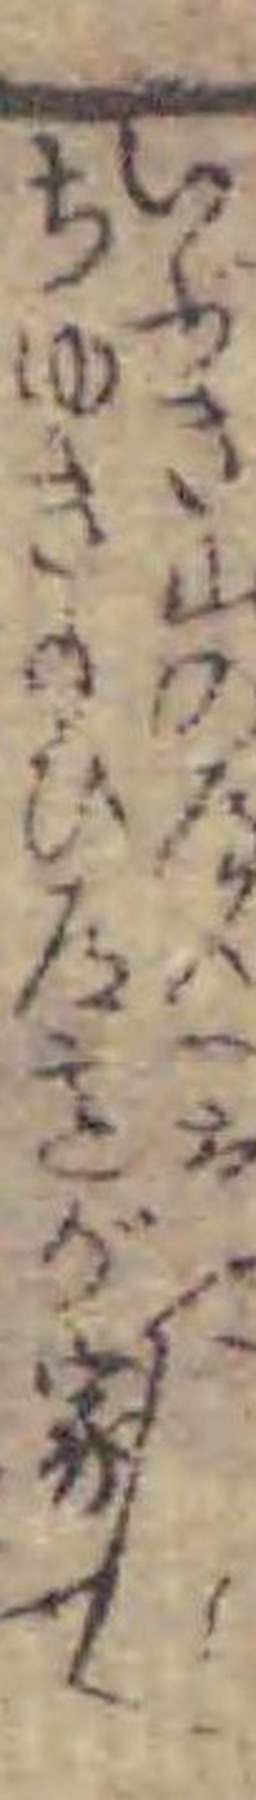ちゆきのひ道意が家
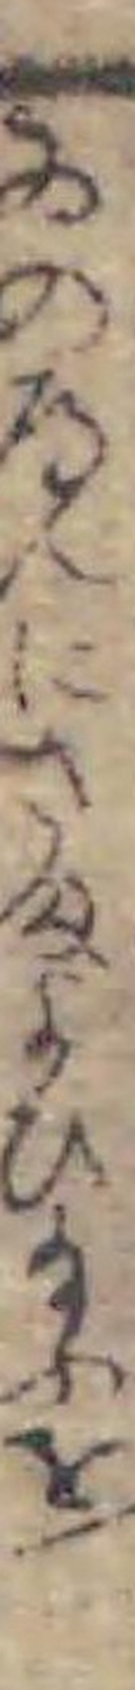ゐのへんにさまよひ給ふを
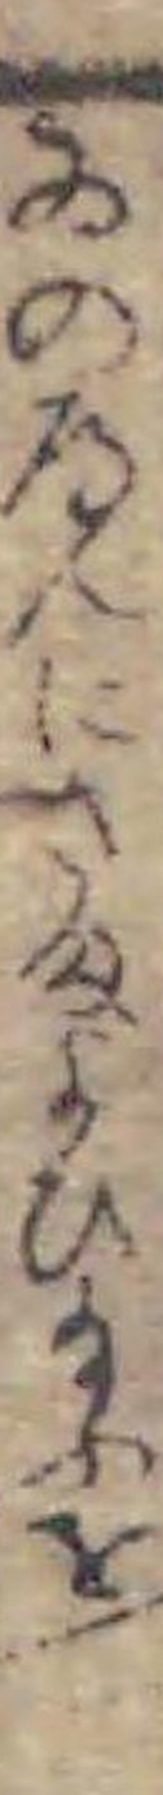ゐのへんにさまよひ給ふを
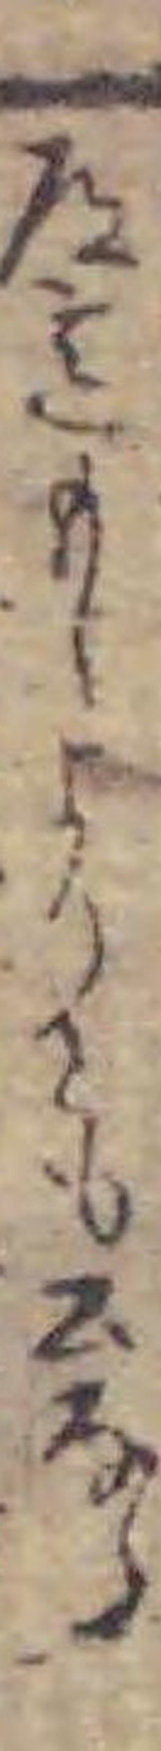道意もしよりとも公なら
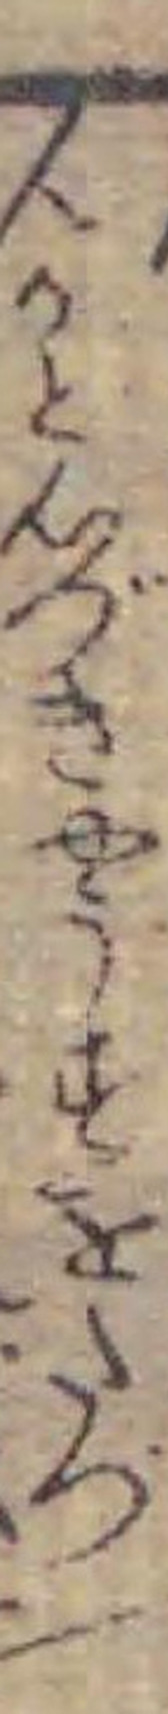人かと心づきやうすをたづ
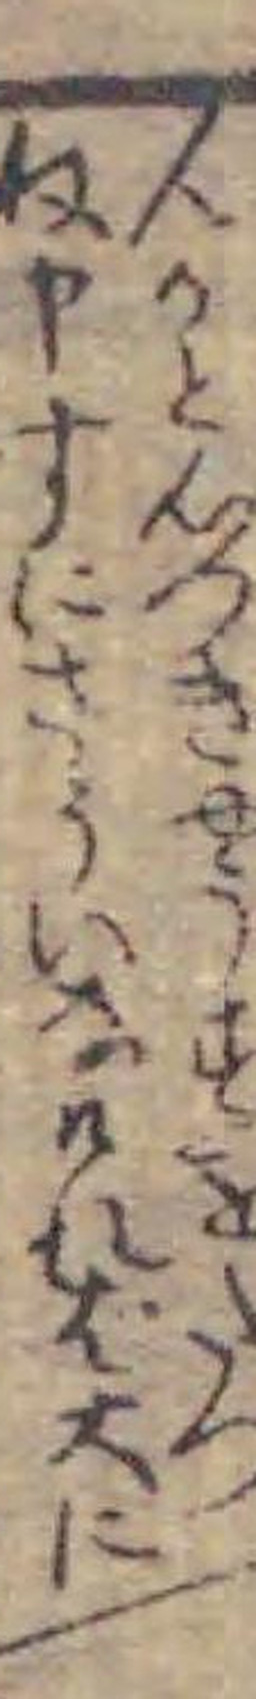ね申すにさういなければ大に
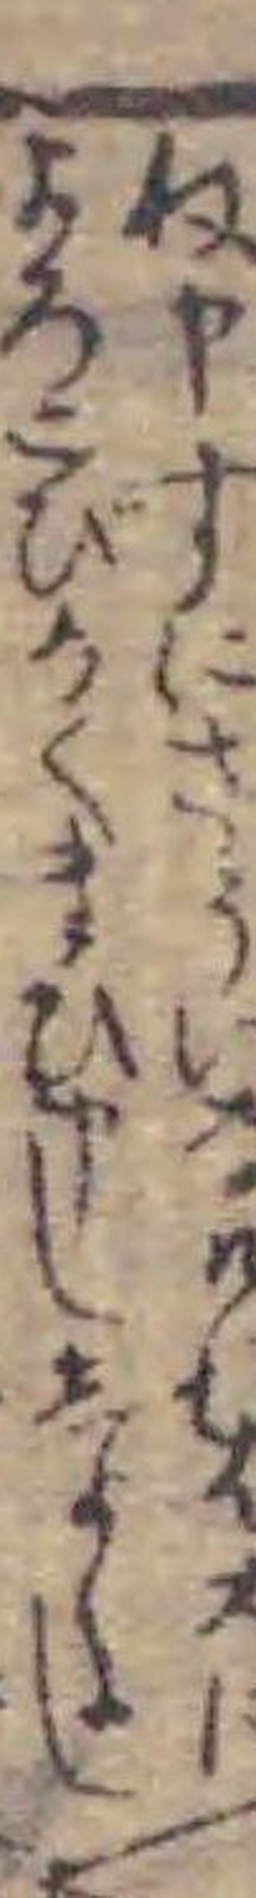よろこびかくまひ申ししよくじ
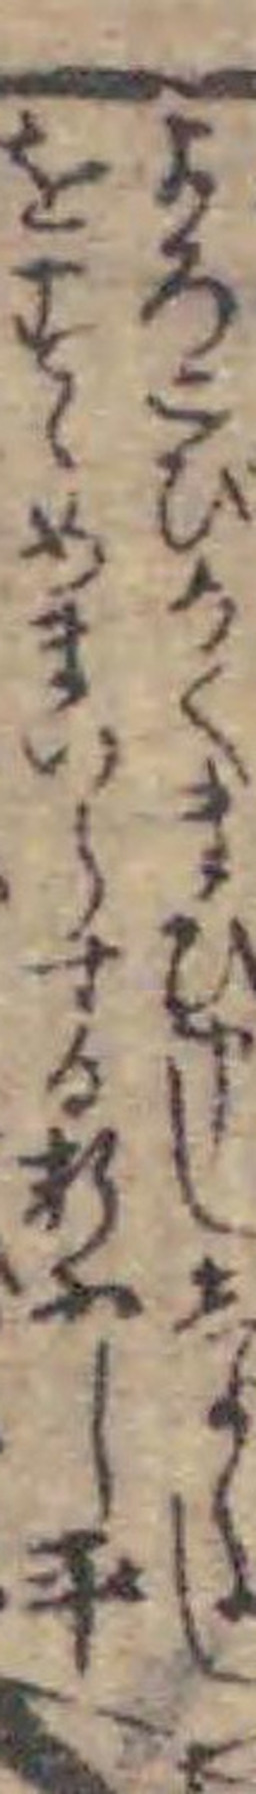をすゝめまいらする折ふし平
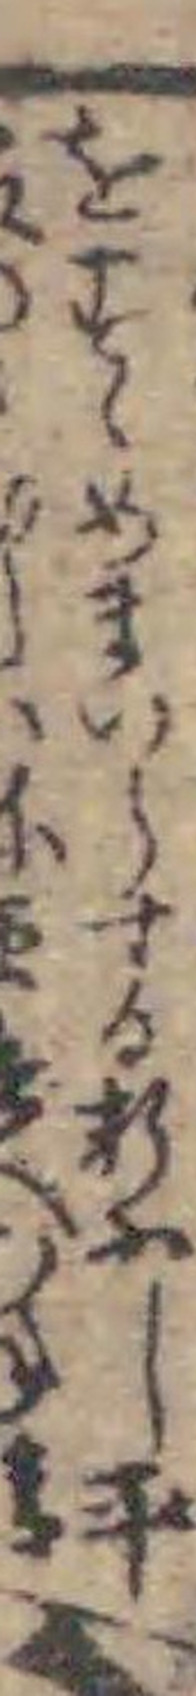をすゝめまいらする折ふし平
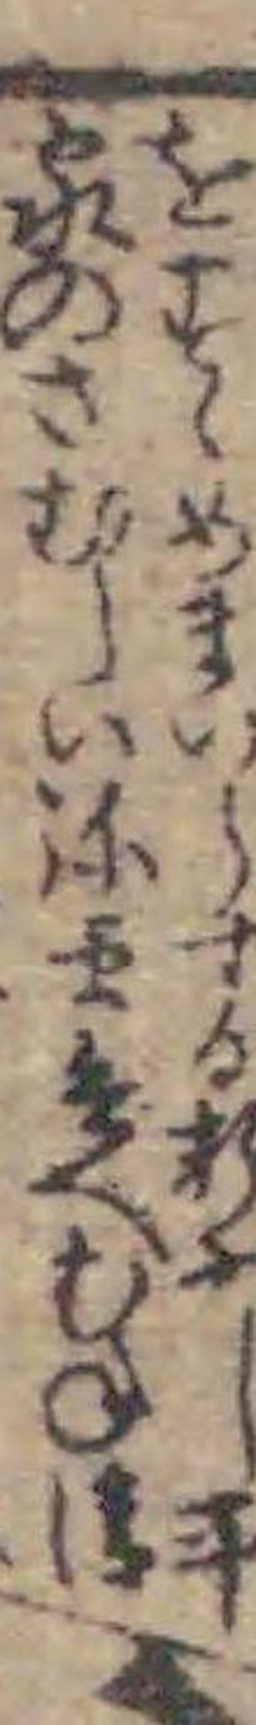家のさむらい弥平兵へむね清
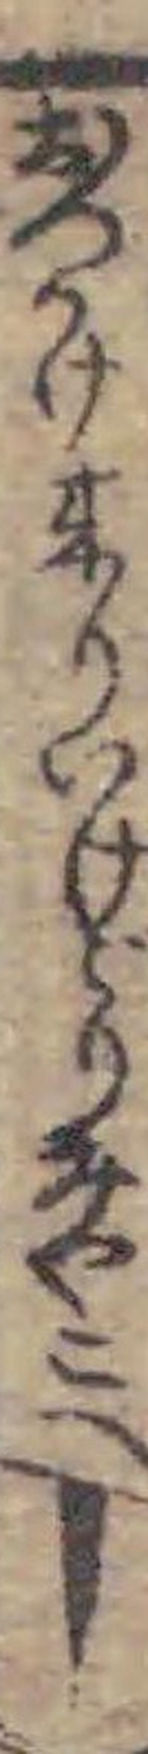おつかけ来りいけどりみやこへ
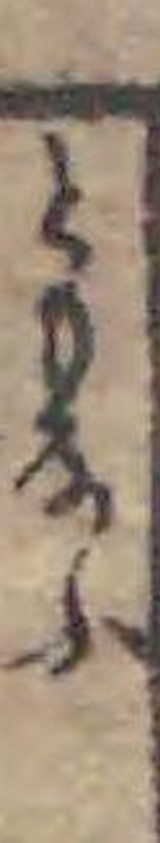ともなふ
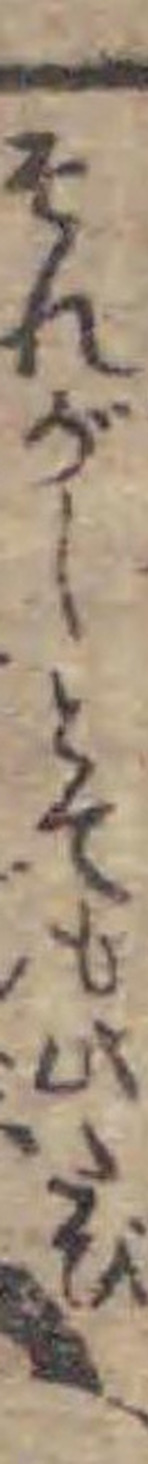それがしとても此たび
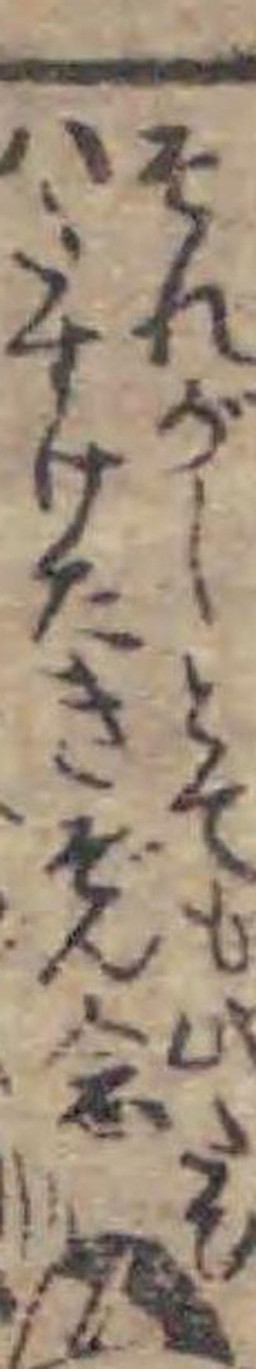はたすけたきぞん念
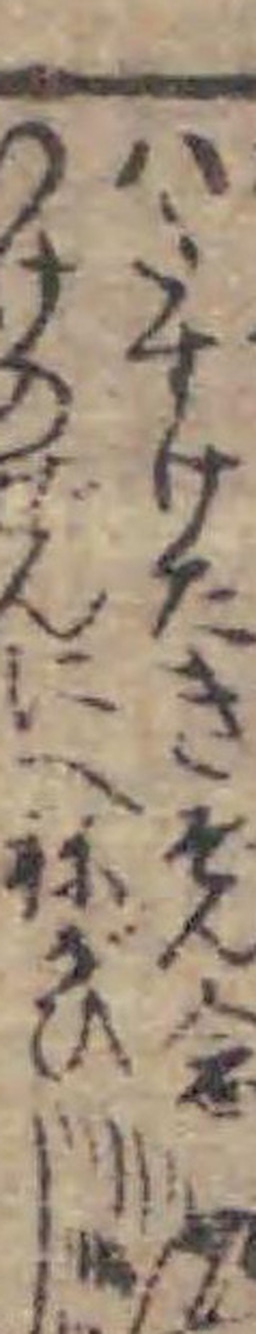いけのぜんにへねがひ
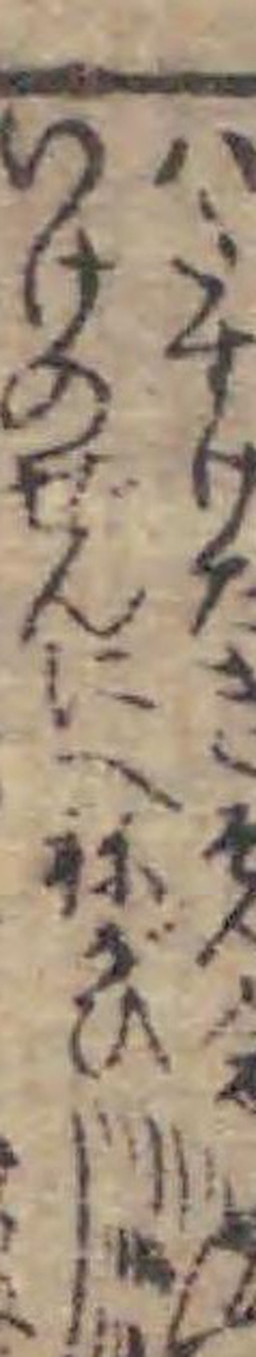いけのぜんにへねがひ
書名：三舛増鱗組 : 3巻
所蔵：国立国会図書館 National Diet Library, JAPAN
